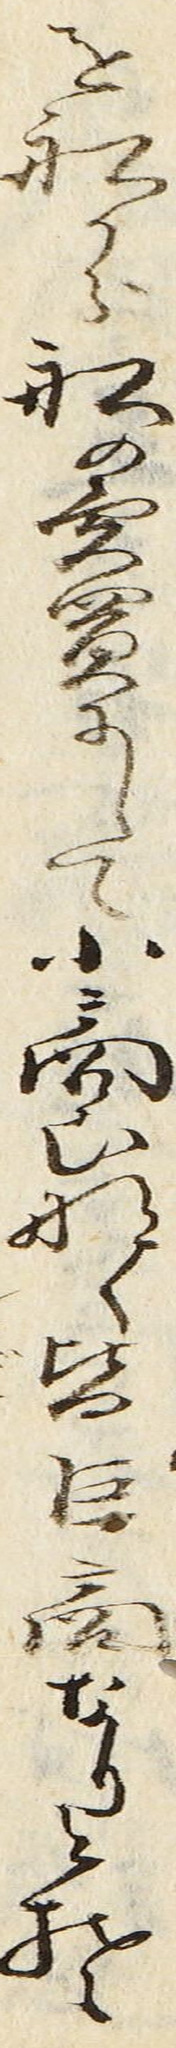を船から船の売買にして小商ひなく皆巨商なりとそ
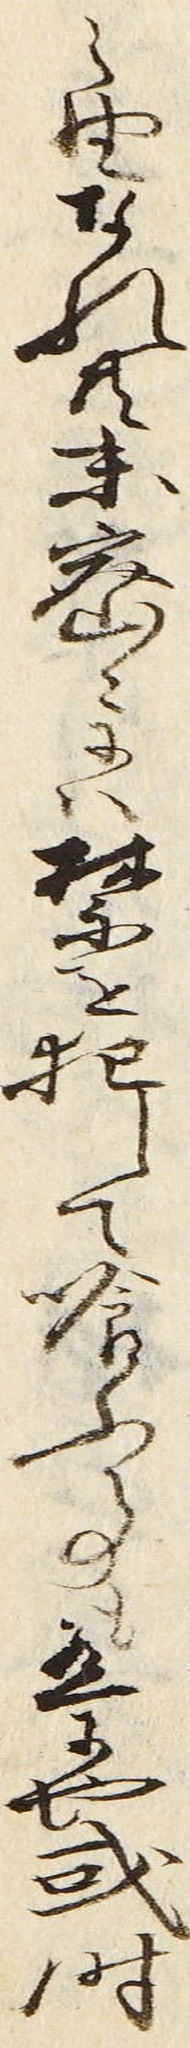之由なれ共未密々にハ禁を犯して喰ふ事も有にや或時
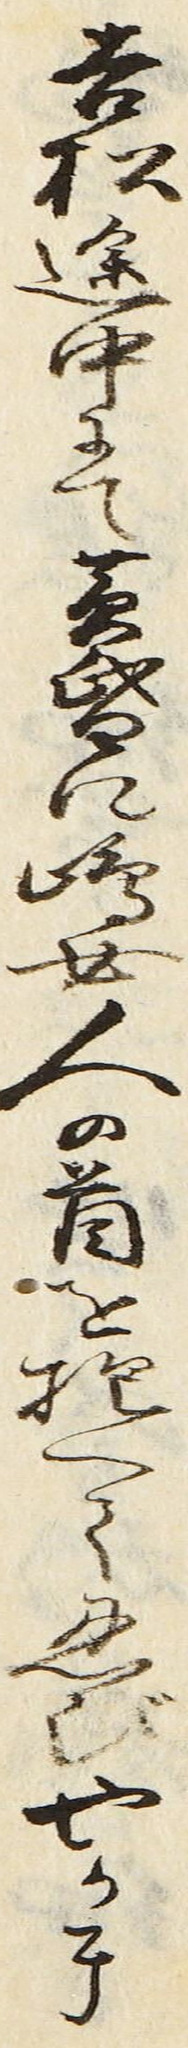吉松途中にて黄昏に島女人の首を抱へて忍びやかに
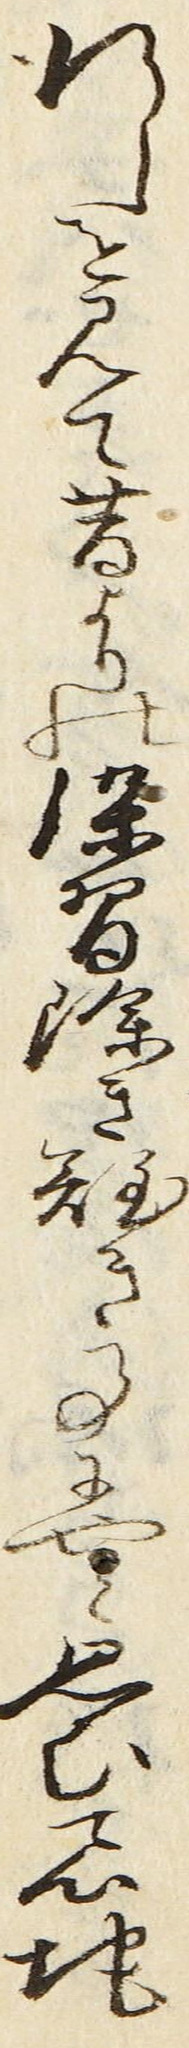行しを見て昔よりの染習除き難き事にやと思ひて心地
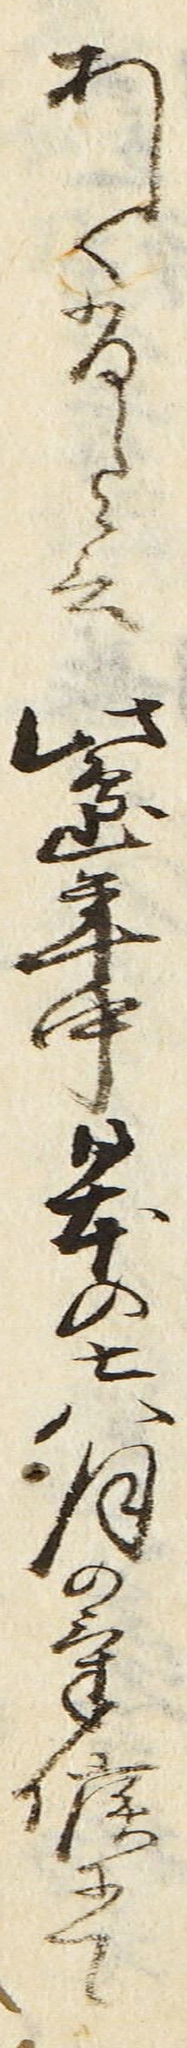あしく有しと言此島年中日本の七八月の気候にて
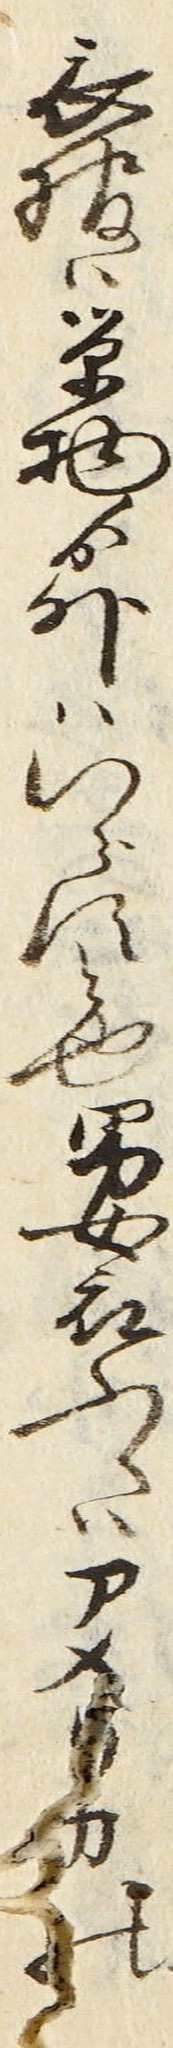衣服ハ単物ゟ外ハいらすと也男女衣ふくハアメリカの
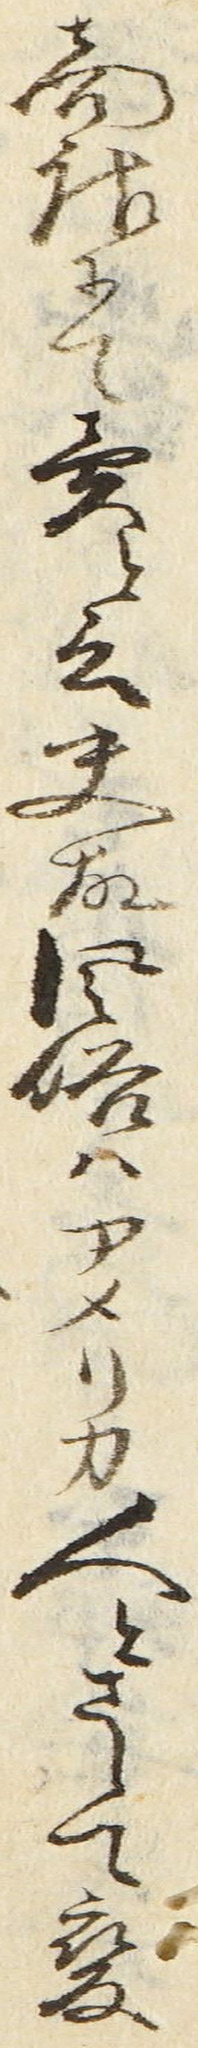商店にて買と云夫故風俗ハアメリカ人とさして変
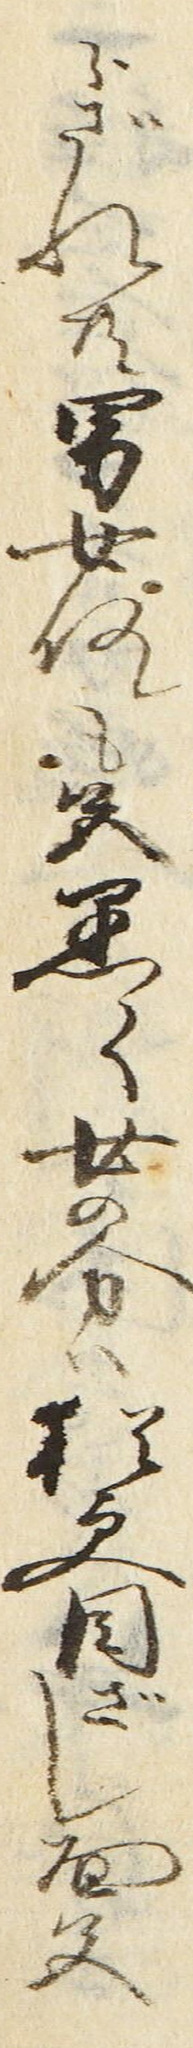らざれ共男女何レも色黒く女の分ハ猶更目ざし面色

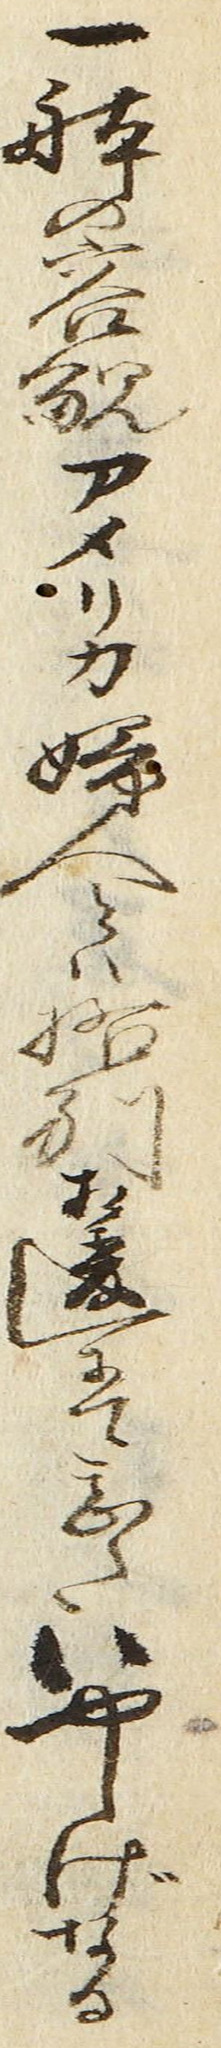一体の容貌アメリカ婦人とハ格別相違にて甚たいやしげなる
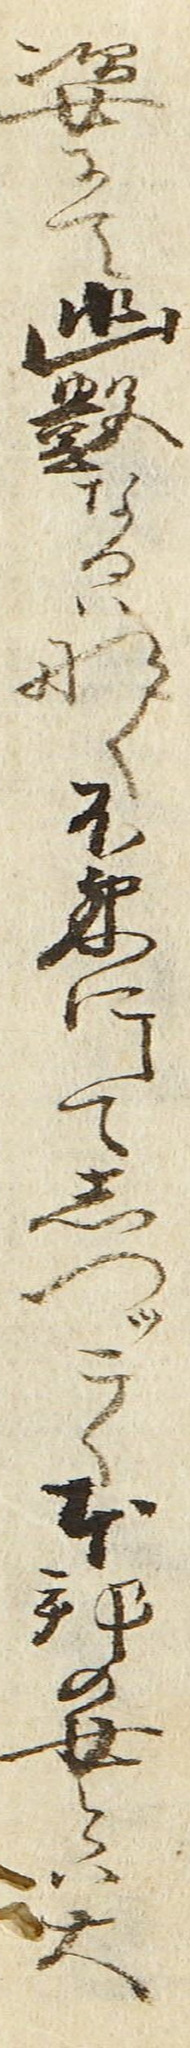姿にて幽艶なるハなく不束にしてしつッこく本邦の女とハ大
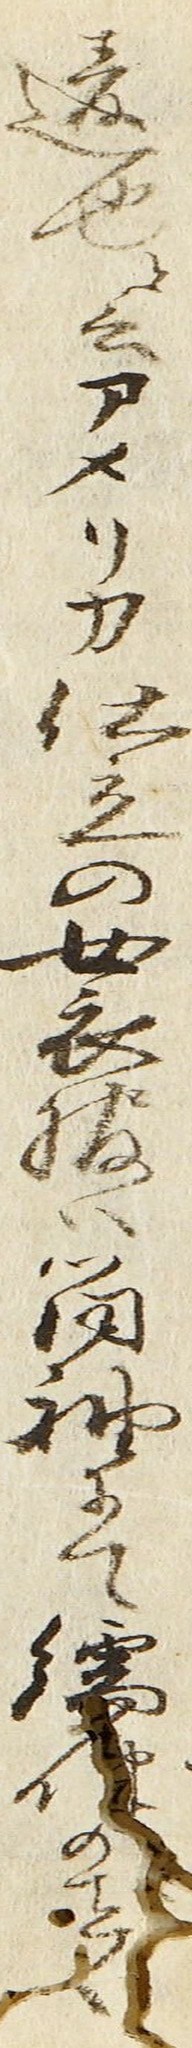違也と云アメリカ仕立の女衣服ハ筒袖にて繻伴のことく
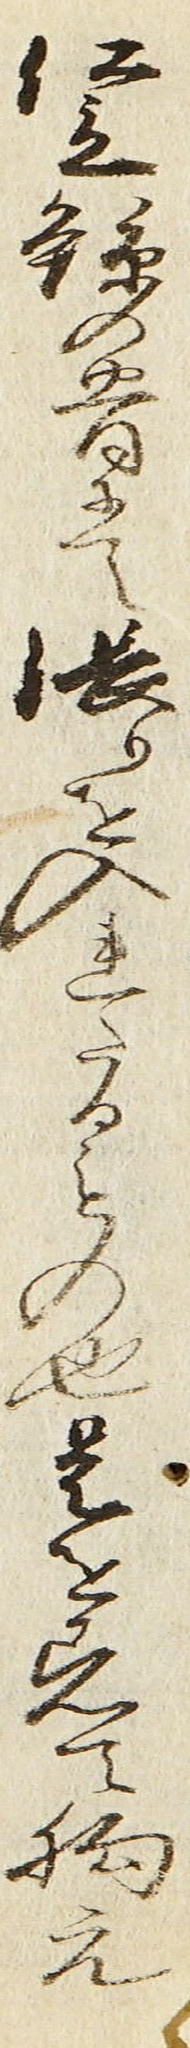仕立鯨の骨にて張りを入れたるとの也是を着て胸元
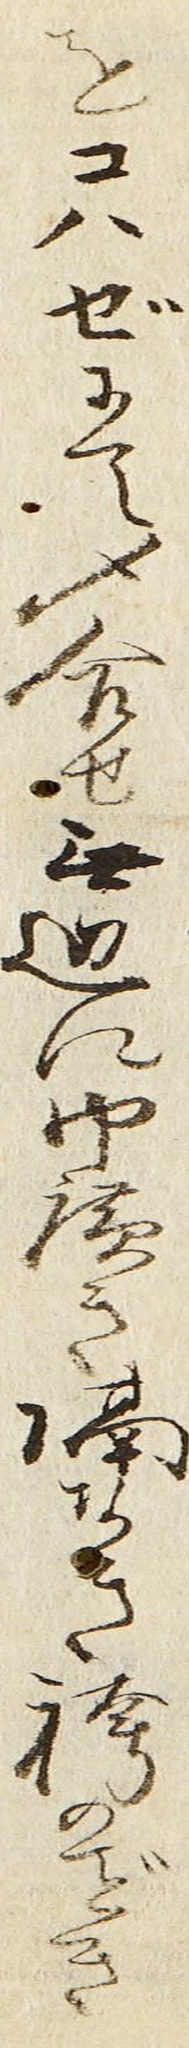をコハゼにて〆合せ無辺に巾広き隔なき袴のごとき
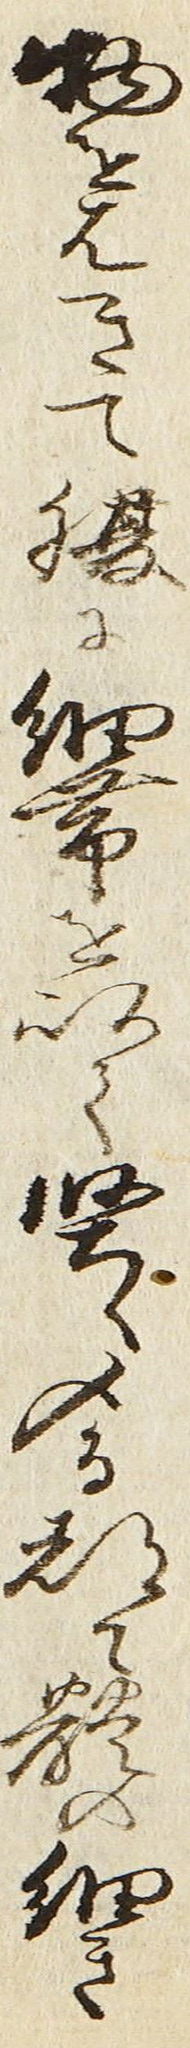物をはきて腹に細帯を以て堅く〆る都て体の細き
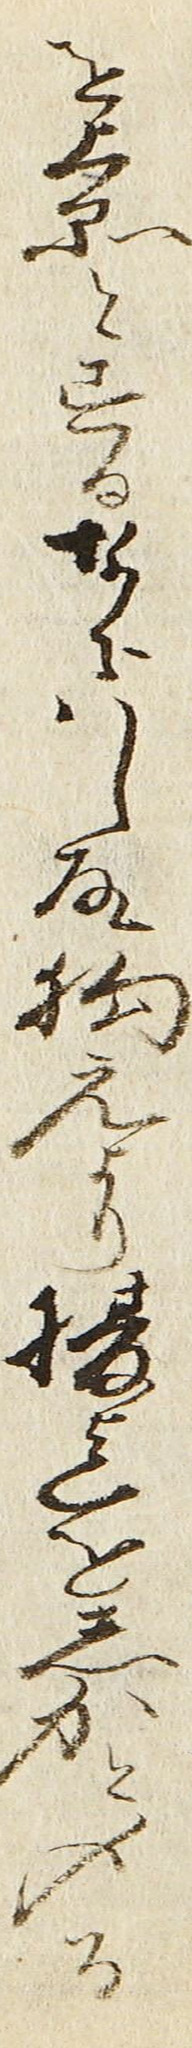を上品とするならハし故胸元より腹迄をしかと〆る
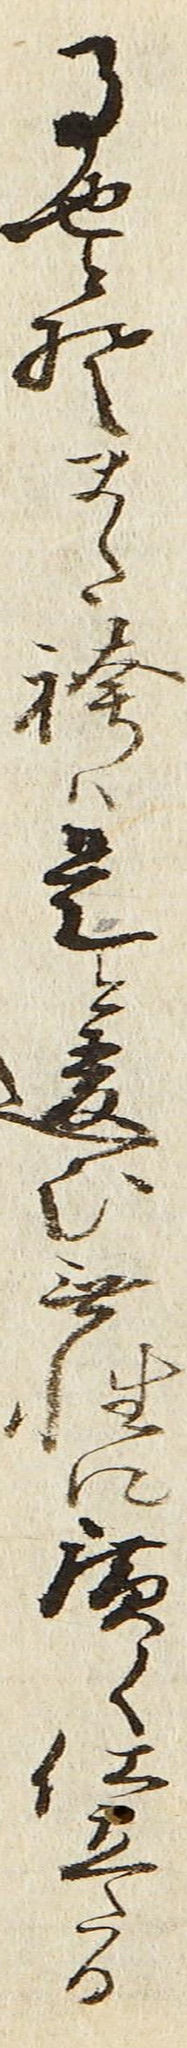事也とそまた袴ハ是と違ひ無性に広く仕立たる
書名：亜墨利加漂流記聞
